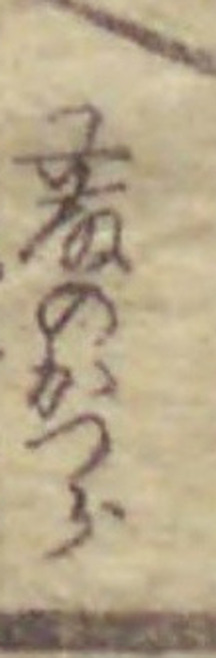工藤のかつら
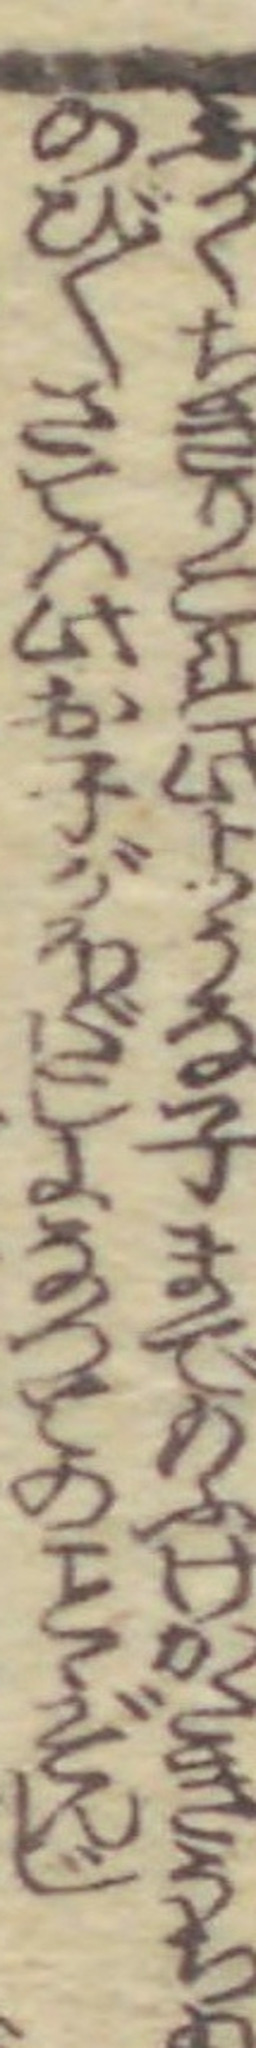のび〳〵さては此お子がほだしになつてのことゝぞんじ
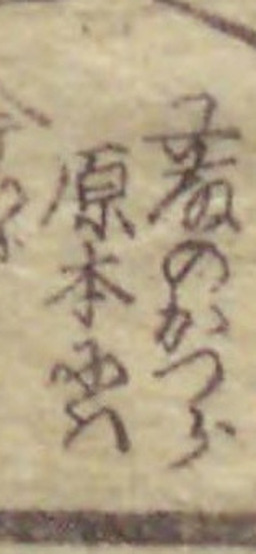原本には
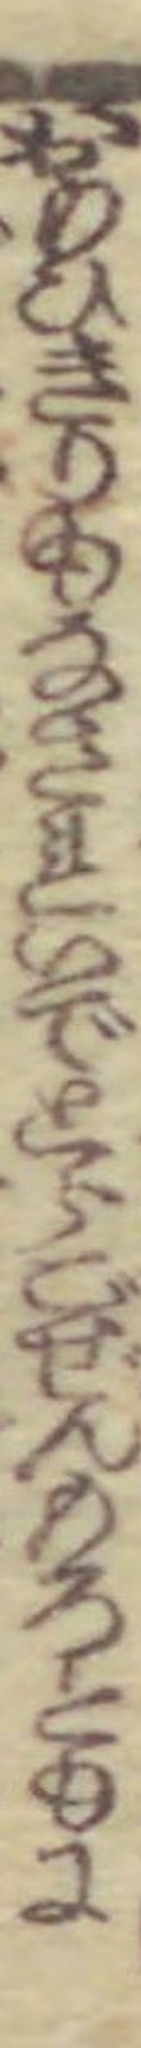おもひきりもなされいでとらごぜんもろともに
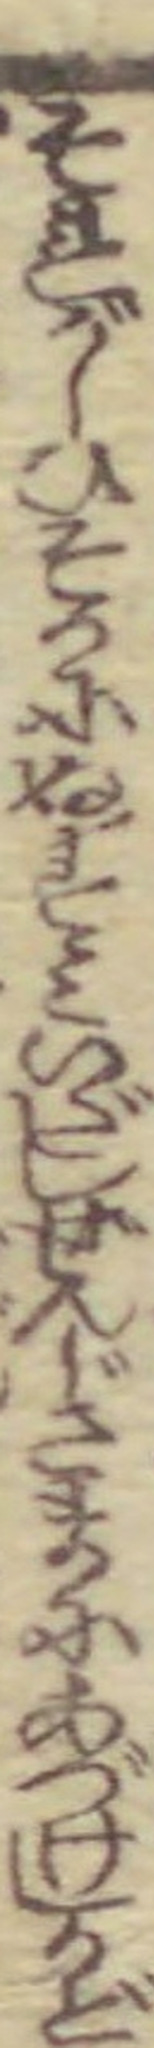それがしひそかにぬすみいだしぜんじさまにあづけしかど
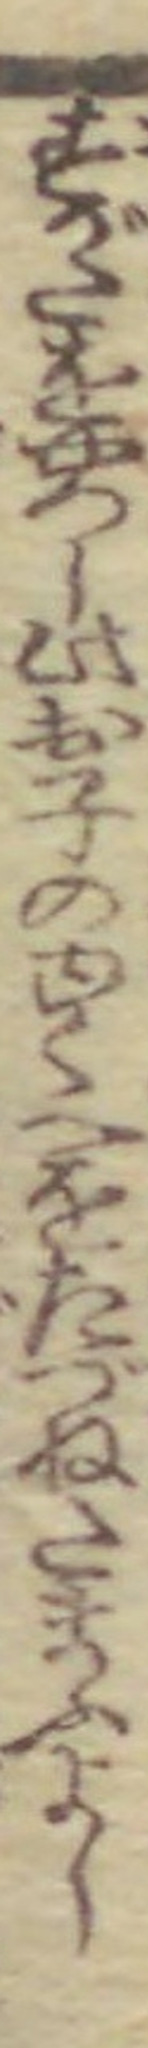すがたをやつし此お子のゆくへをたづねたまふよし
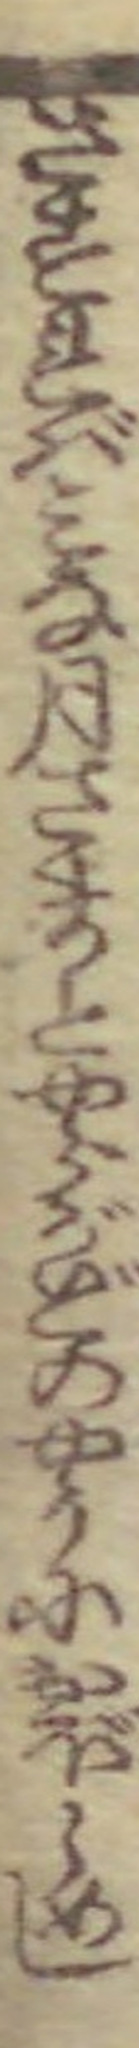さすればみな月さまとやらがどのやうにおぼしめし
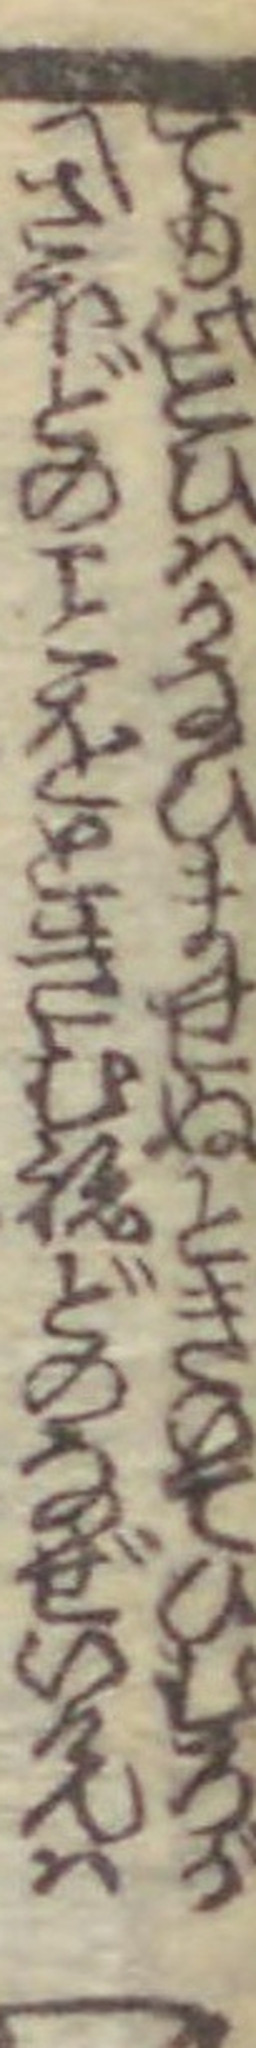〽さほどのことをときむねどのなぜいけんは
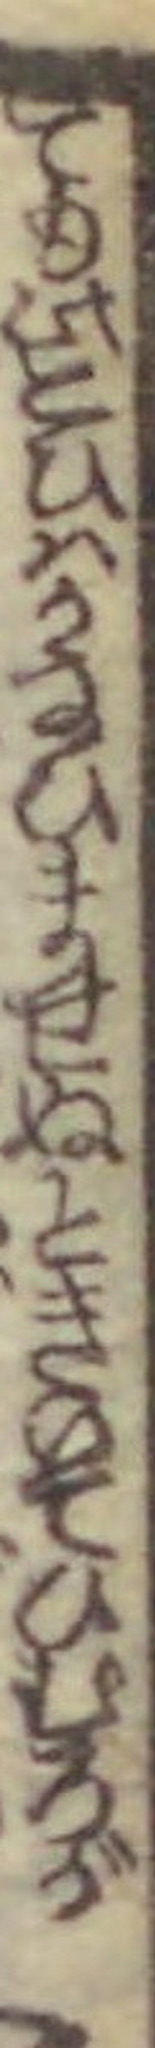ても此こひはかなひませぬときいてひむろが
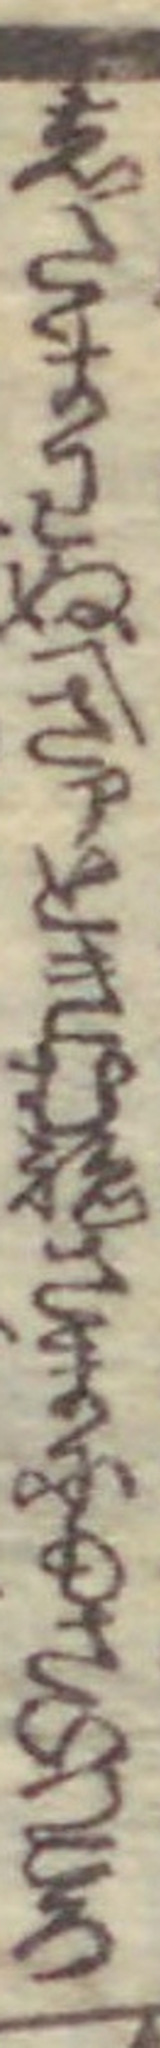したまわぬ〽さアときむねさまにもさいつころ
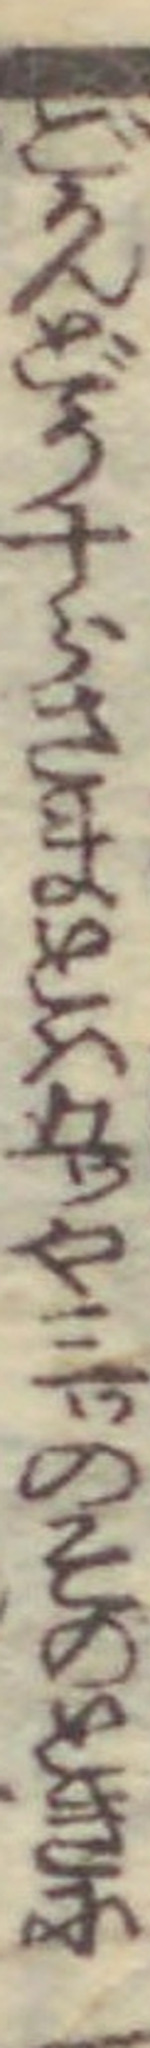ごかんどう十郎さまとは五ツや三ツもそのときに
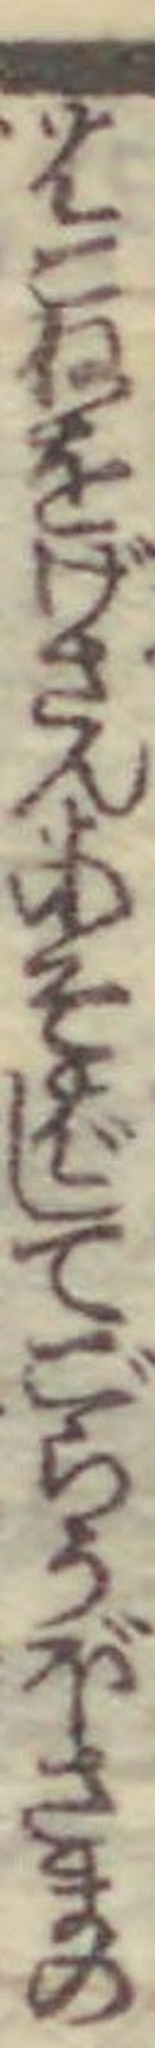はこねをげさんあそばしてごらうぼさまの
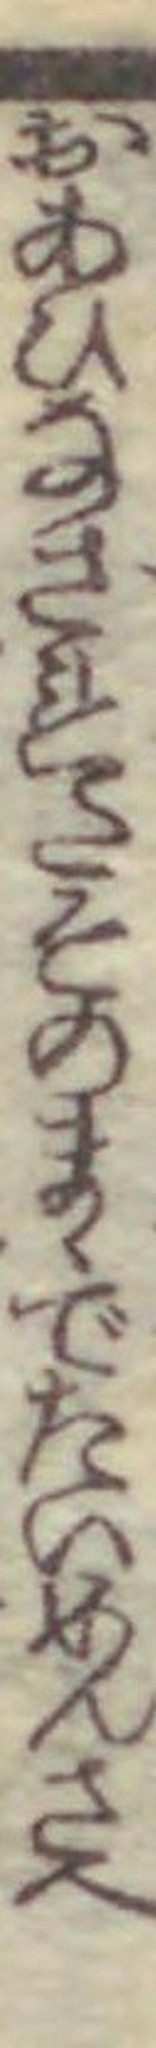おあひなされたそのまゝでたいめんさへ
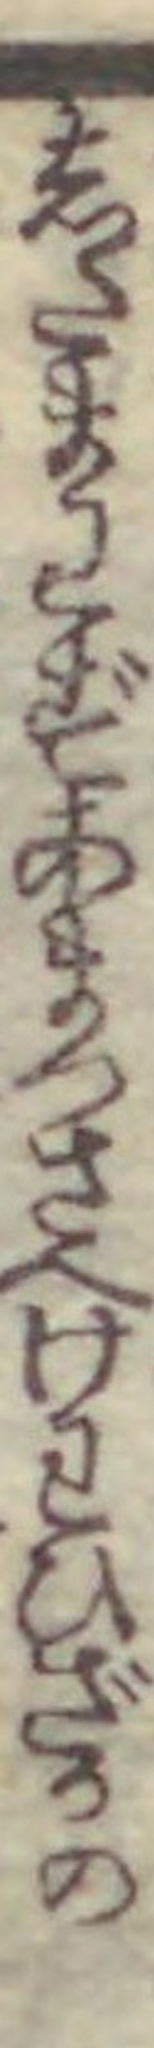したまわずあまつさへけわひざかの
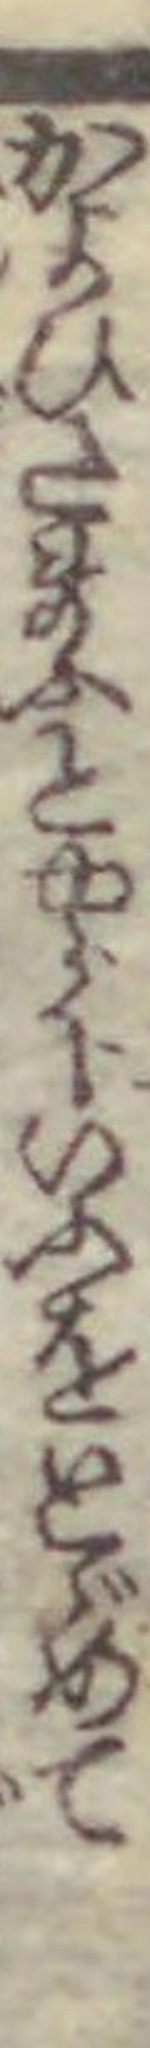かよひたまふとやらといふをとゞめて
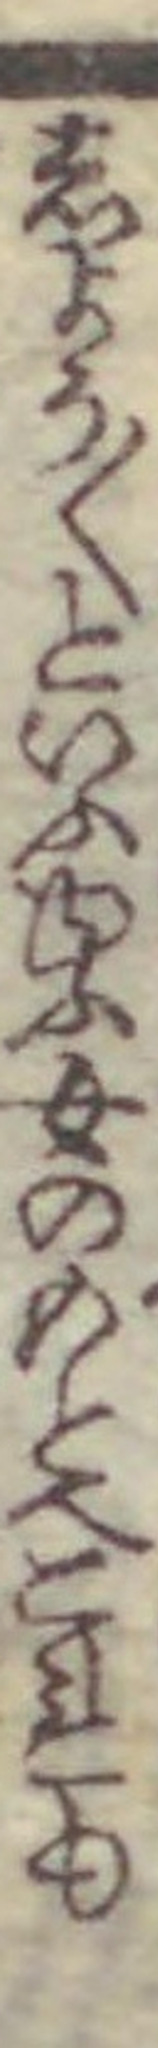しよう〳〵といふゆう女のもとへこれも
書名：大時代唐土化物 3巻. 曽我太夫染
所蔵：国立国会図書館 National Diet Library, JAPAN
